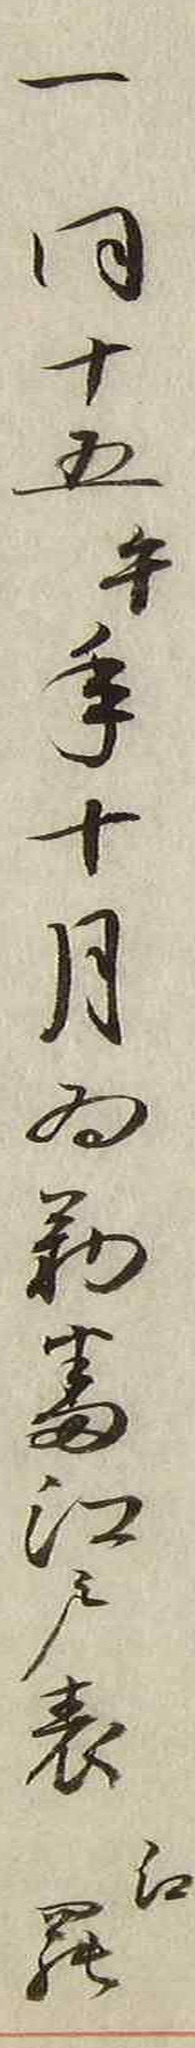一同十五午年十月為勤番江戸表江罷
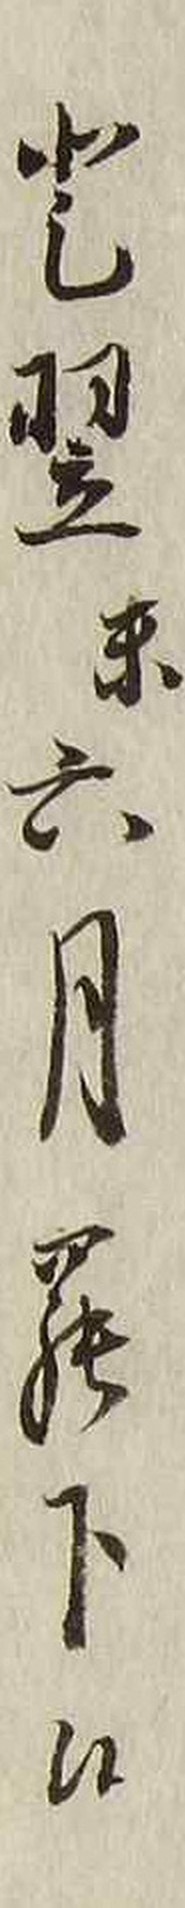登翌末六月罷下候
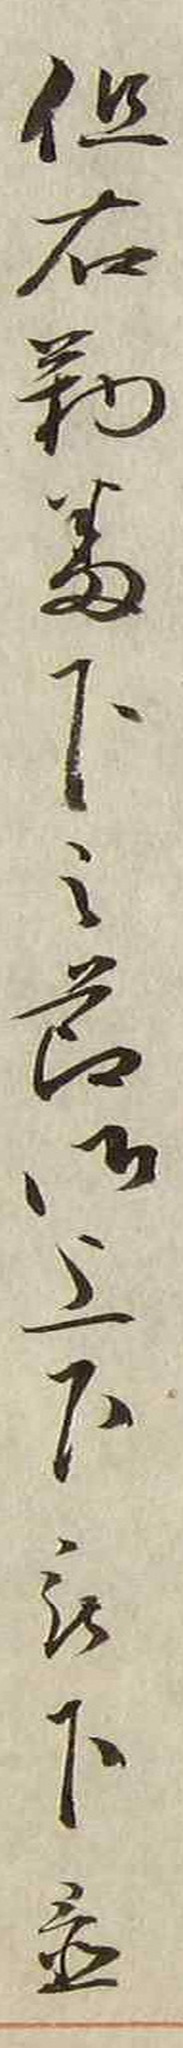但右勤番下之節御上下被下置

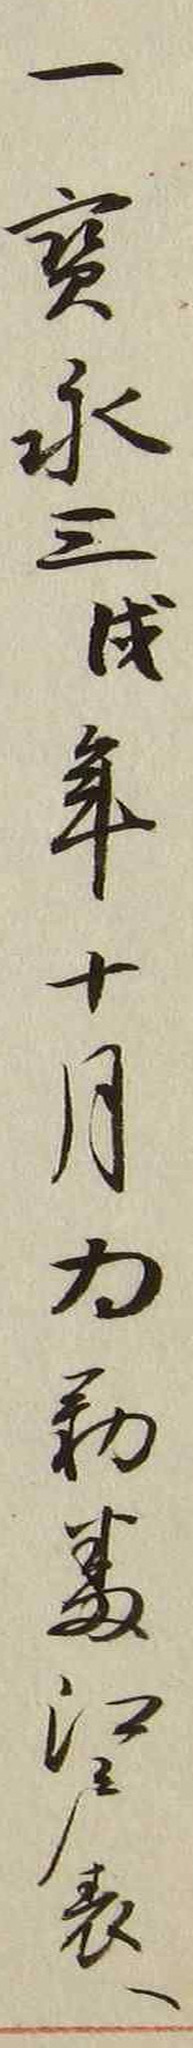一宝永三戌年十月為勤番江戸表へ
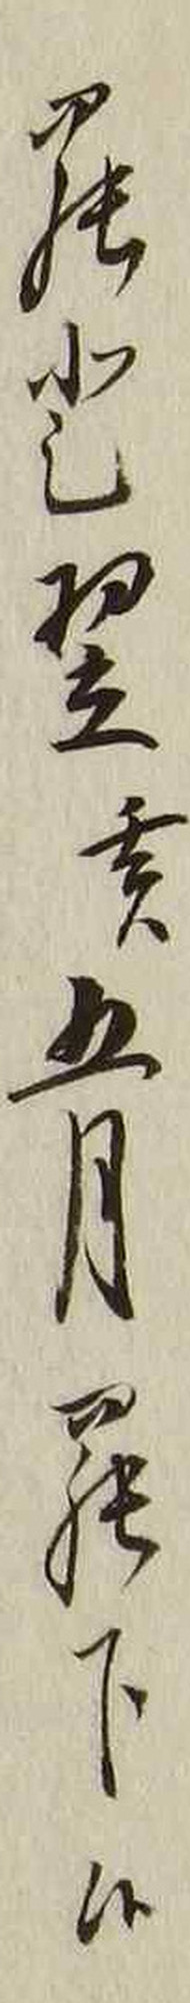罷登翌亥五月罷下候
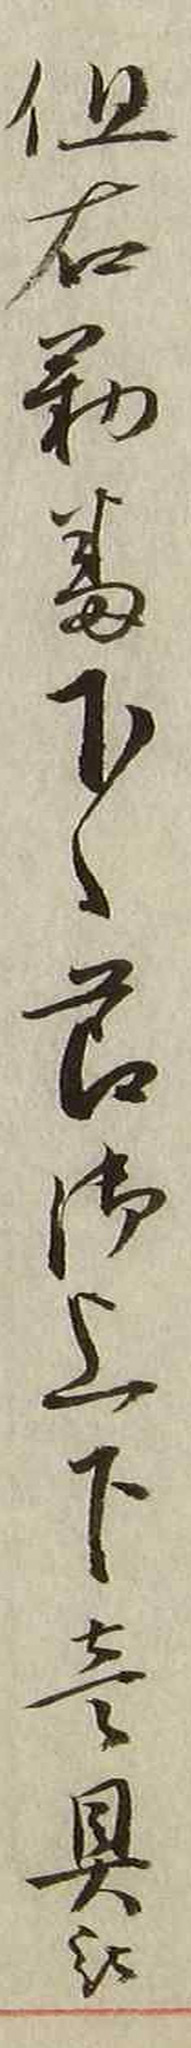但右勤番下候節御上下壱具被
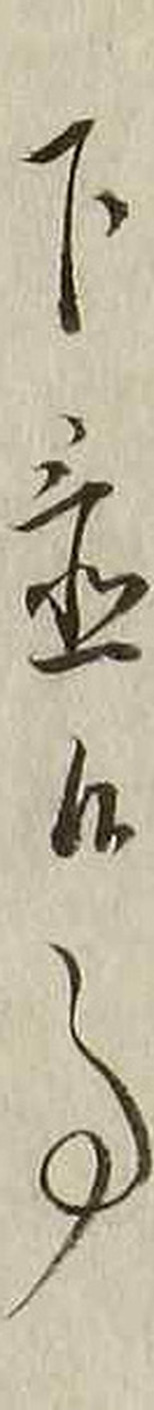下置候事
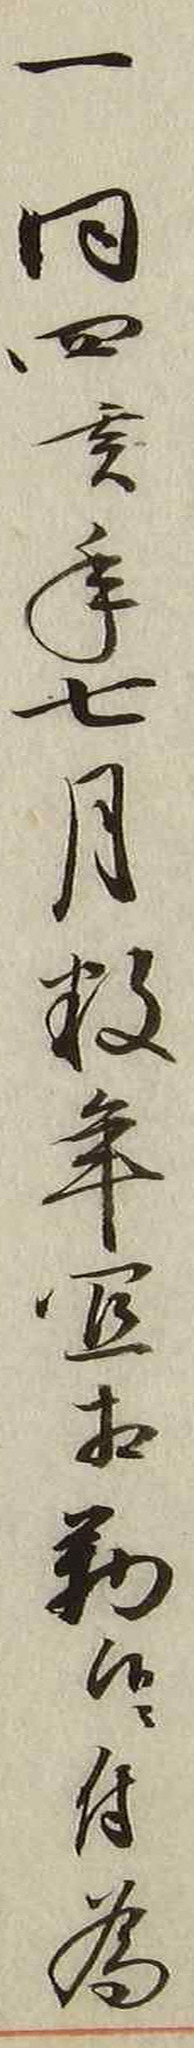一同四亥年七月数年宜相勤候ニ付為
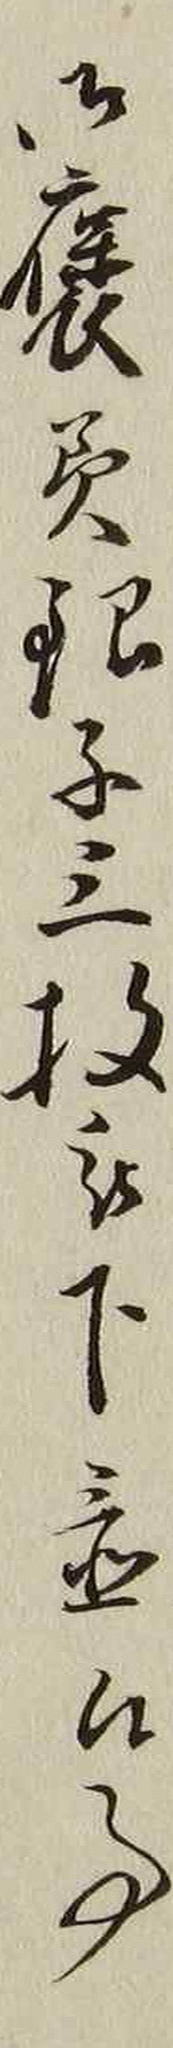御褒美銀子三枚被下置候事
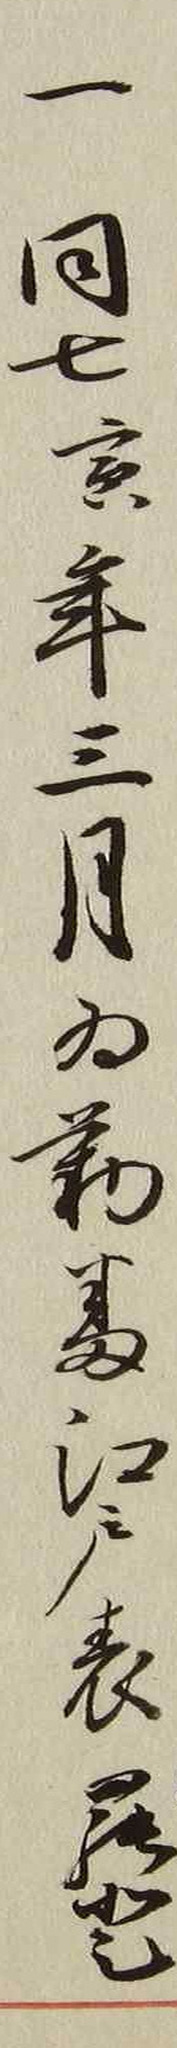一同七寅年三月為勤番江戸表江罷登
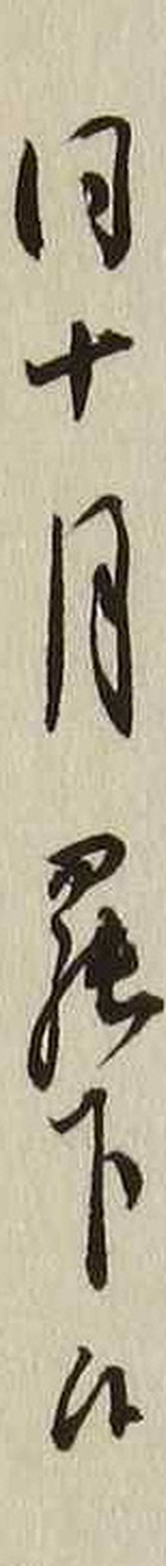同十月罷下候
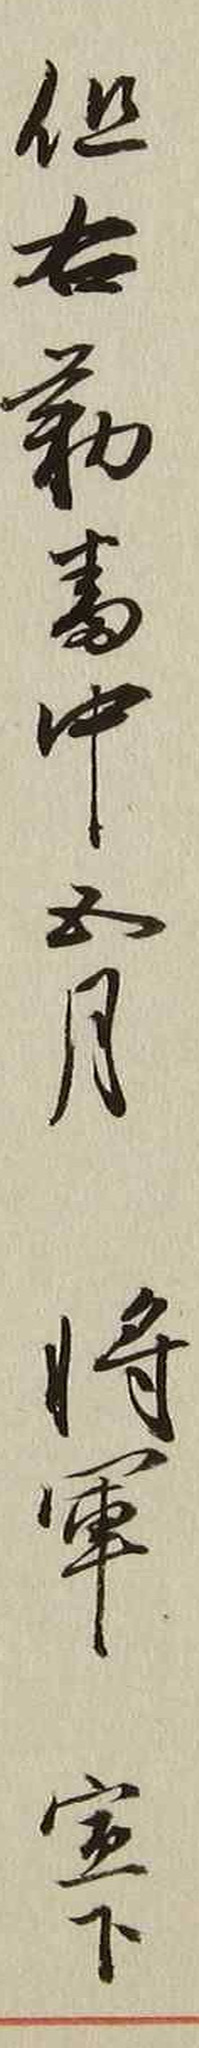但右勤番中五月将軍宣下
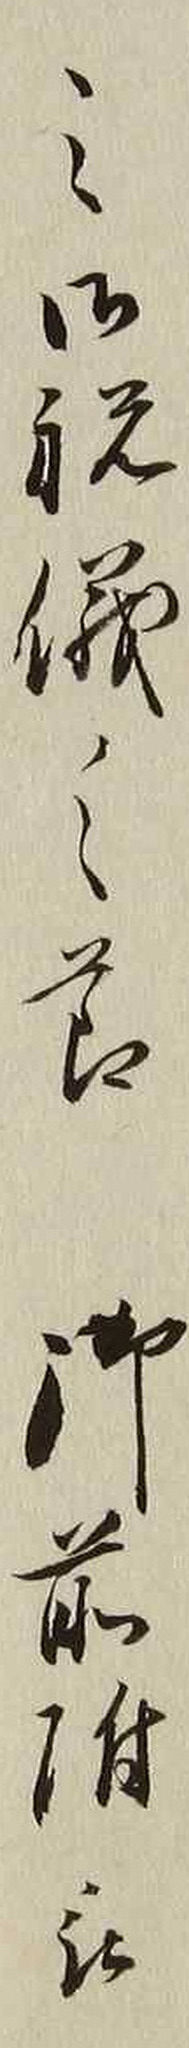之御祝儀之節御前附被
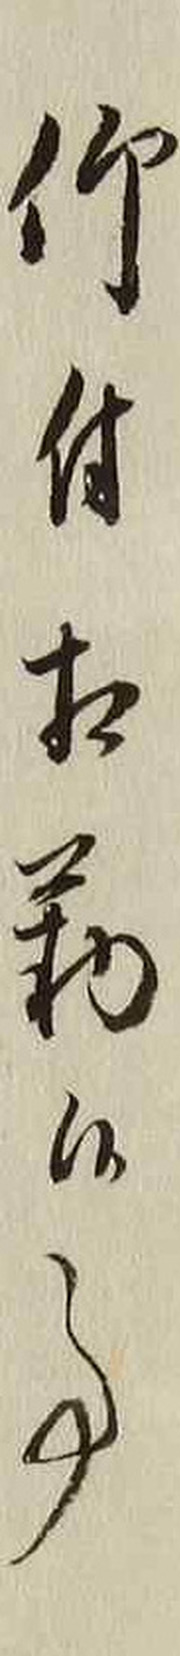仰付相勤候事
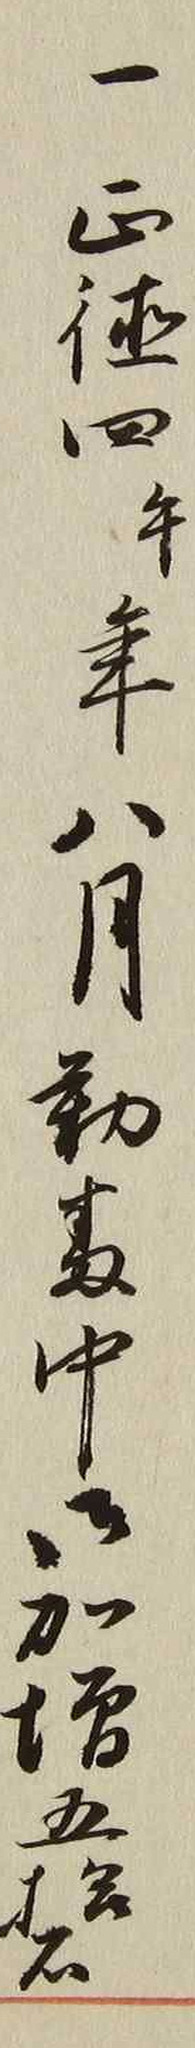一正徳四午年八月勤番中御加増五拾石
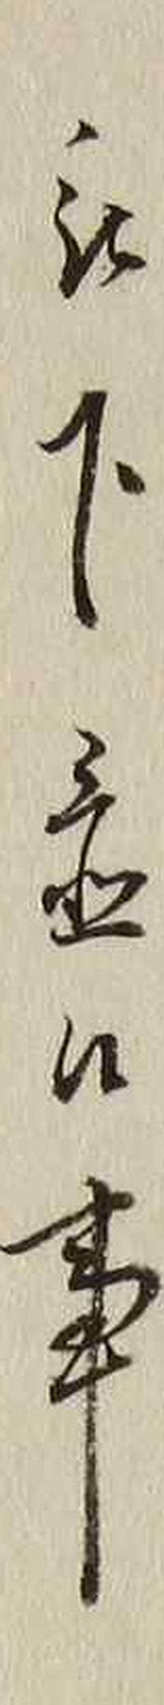被下置候事
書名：諸士系譜　巻之22　い之部22
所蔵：会津若松市立会津図書館
